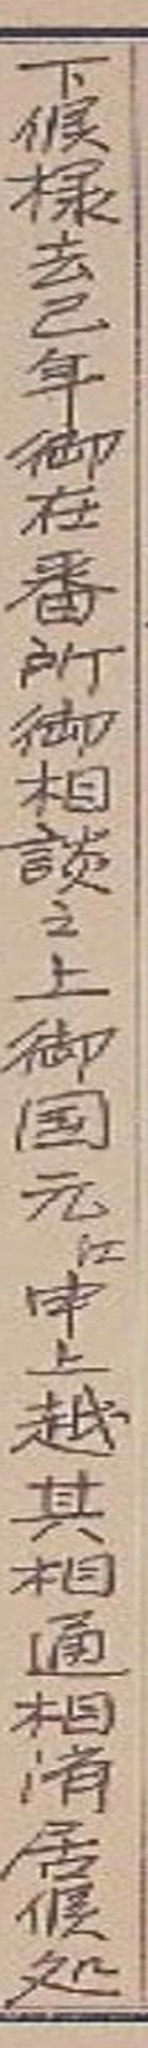下候様去巳年御在番所御相談之上御国元え申上越其相通相済居候処
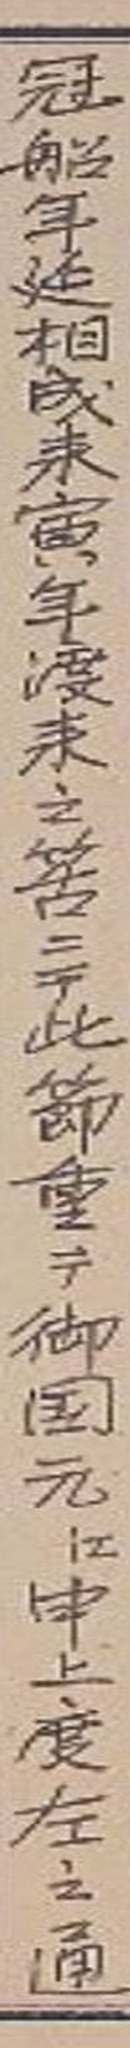冠船年延相成来寅年渡来之筈にて此節重て御国元え申上度左之通
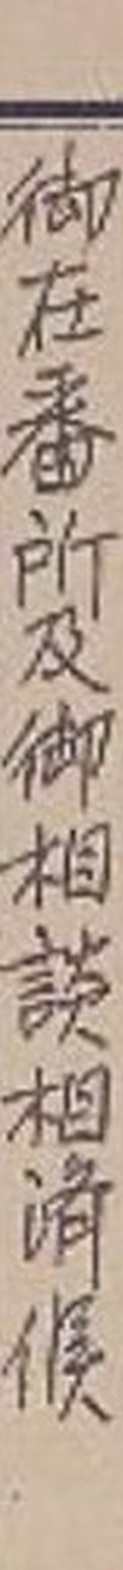御在番所及御相談相済候
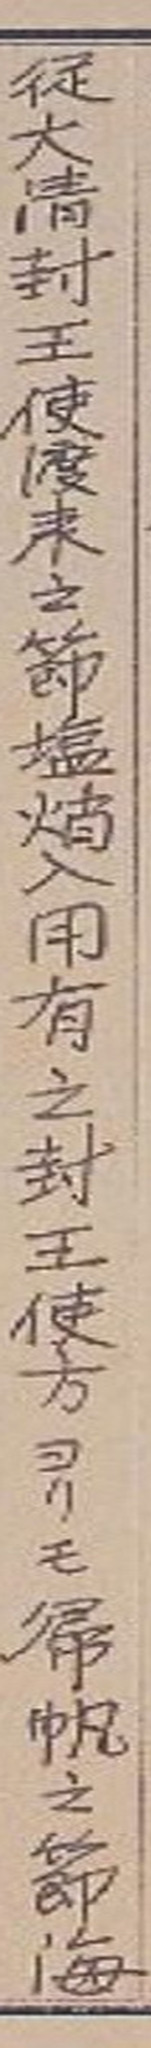従大清封王使渡来之節塩硝入用有之封王使方よりも帰帆之節海
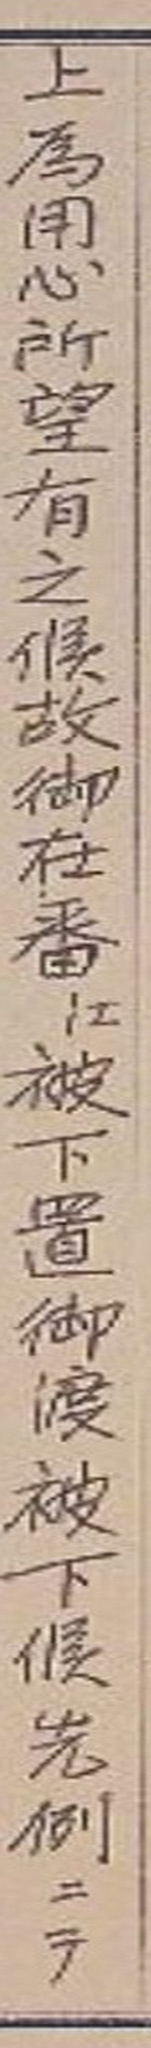上為用心所望有之候故御在番え被下置御渡被下候先例にて
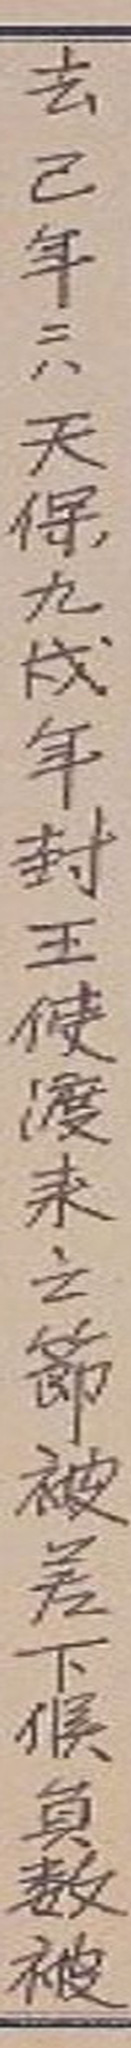去巳年には天保九戌年封王使渡来之節被差下候員数被
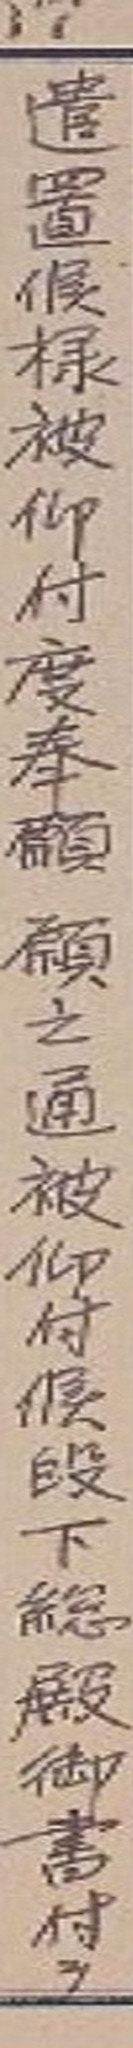遣置候様被仰付度奉願願之通被仰付候段下総殿御書付を
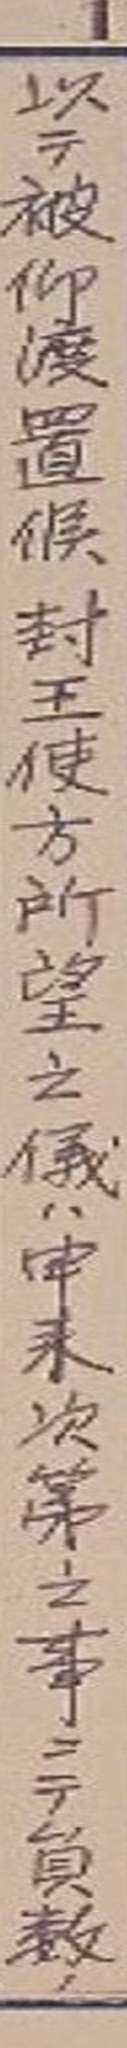以て被仰渡置候封王使方所望之儀は申来次第之事にて員数の
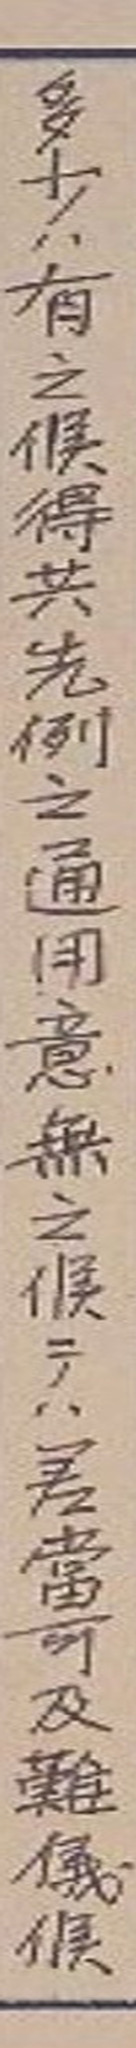多少は有之候得共先例之通用意無之候ては差当可及難儀候
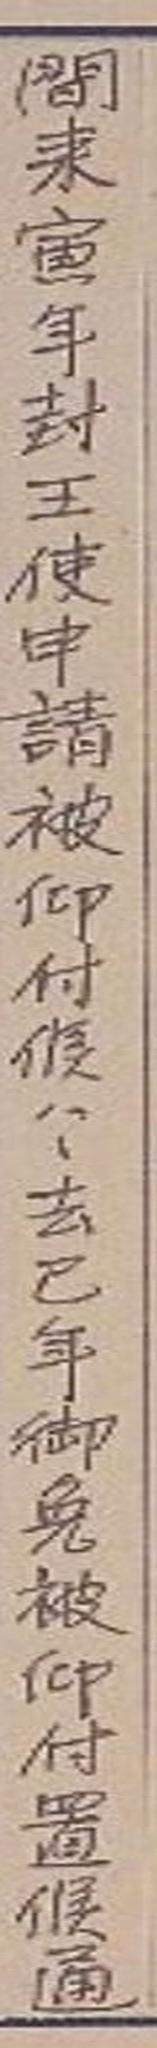間来寅年封王使申請被仰付候はゝ去巳年御免被仰付置候通
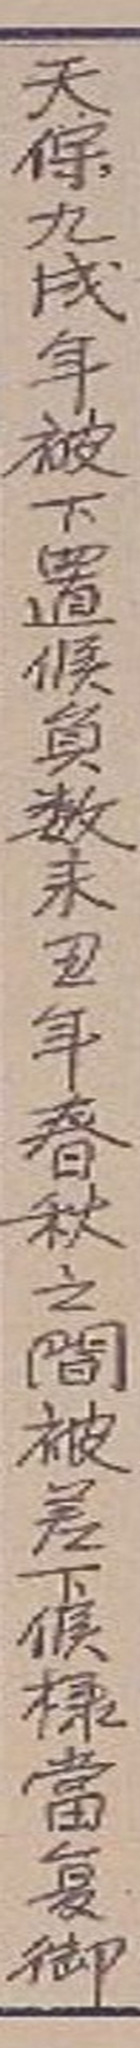天保九戌年被下置候員数来丑年春秋之間被差下候様当夏御

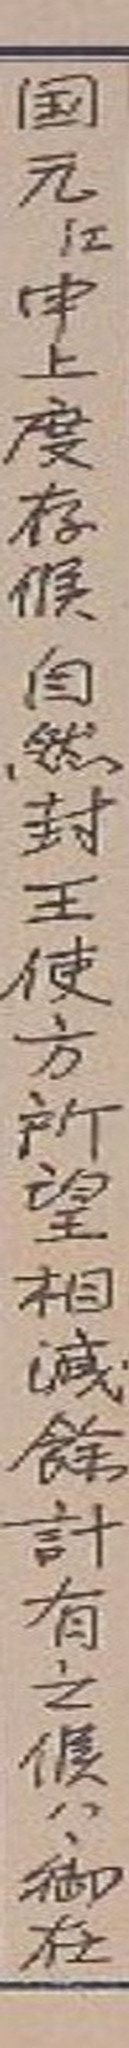国元え申上度存候間自然封王使方所望相減余計有之候はゝ御在
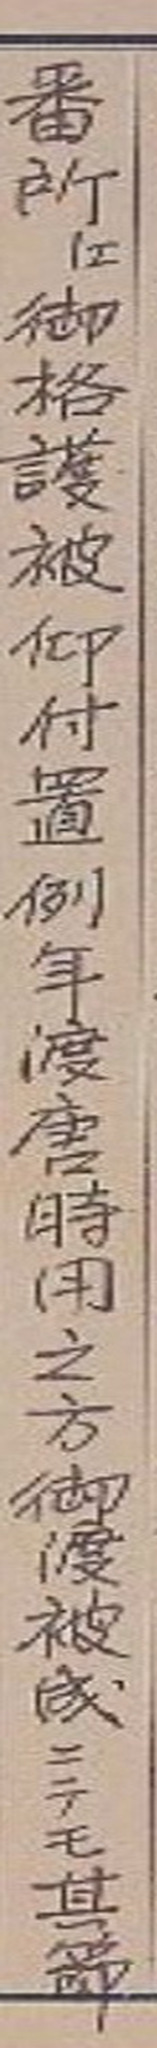番所え御格護被仰付置例年渡唐時用之方御渡被成にても其節
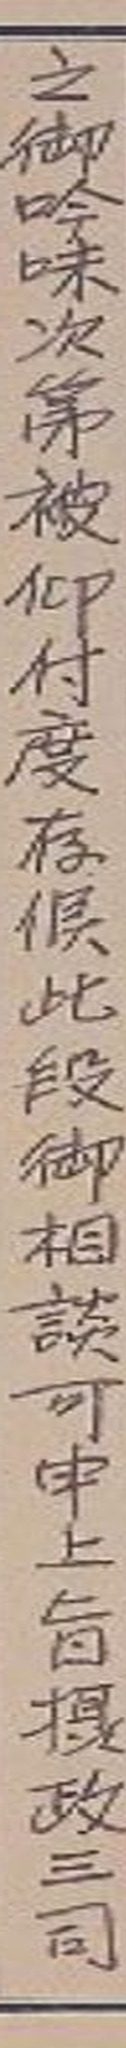之御吟味次第被仰付度存候此段御相談可申上旨摂政三司
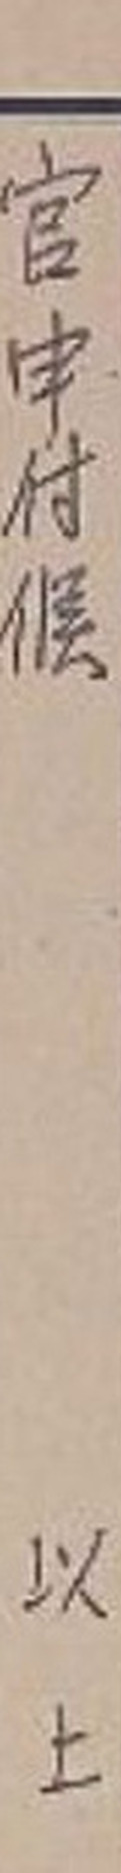官申付候以上
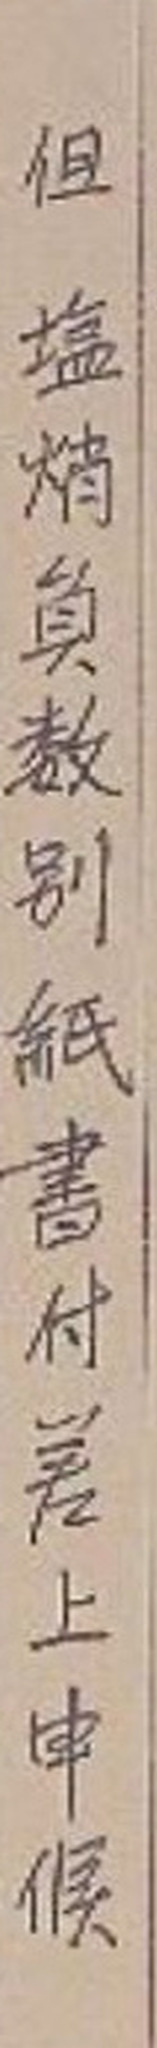但塩硝員数別紙書付差上申候
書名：支那冊封使来琉諸記 下巻
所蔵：University of the Ryukyus Library
